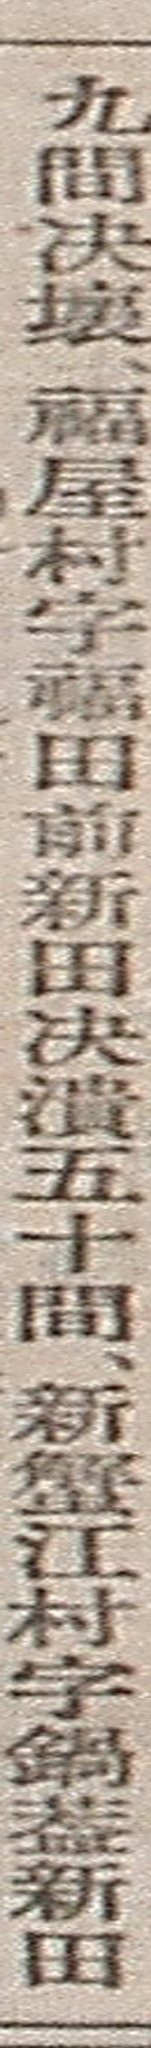九間決壊、福屋村字福田前新田决潰五十間、新蟹江村字鍋蓋新田
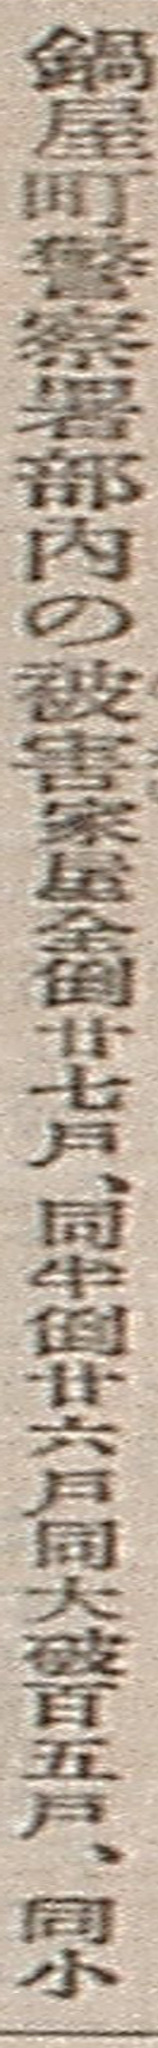鍋屋町警察署部内の被害家屋全倒廿七戸、同半倒廿六戸同大破百五戸、同小
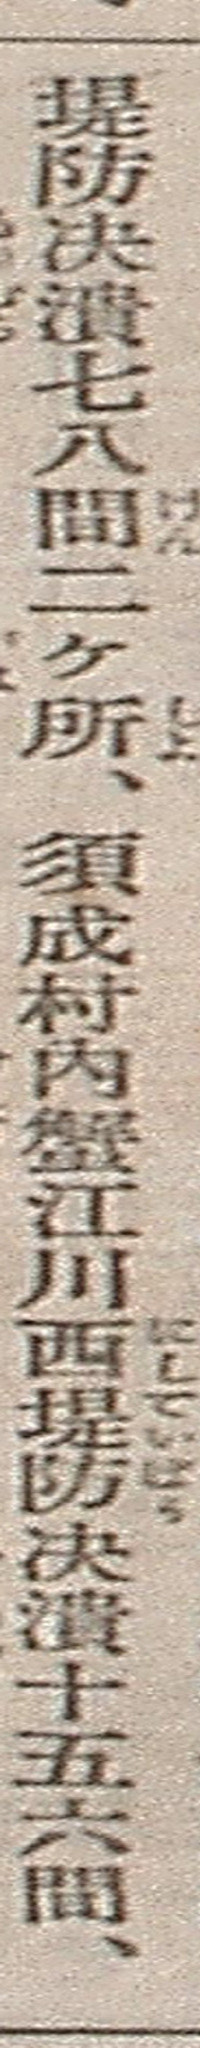堤防決潰七八間二ヶ所、須成村内蟹江川西堤防决潰十五六間、
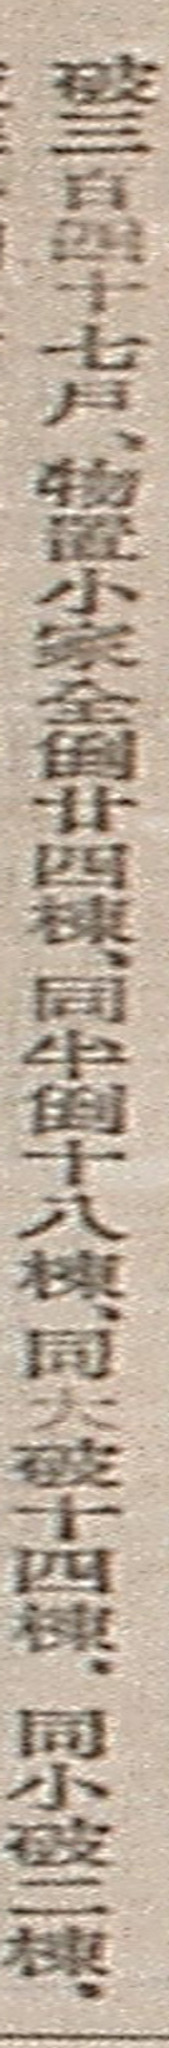破三百四十七戸、物置小家全倒廿四棟、同半倒十八棟、同大破十四棟、同小破二棟、
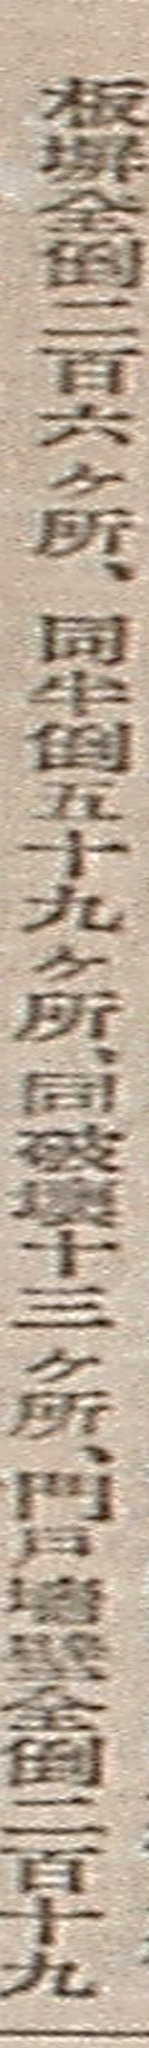板塀全倒二百六ヶ所、同半倒五十九ヶ所、同破壊十三ヶ所、門戸墻壁全倒二百十九
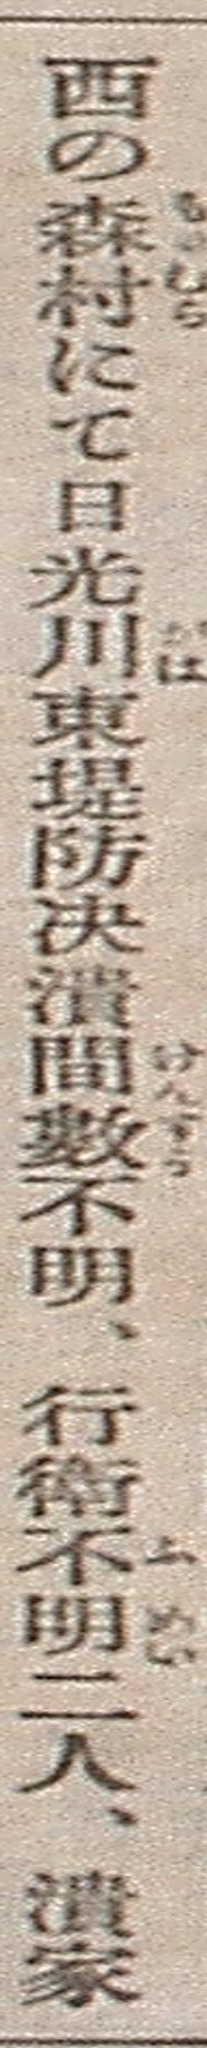西の森村にて日光川東堤防决潰間数不明、行衛不明二人、潰家
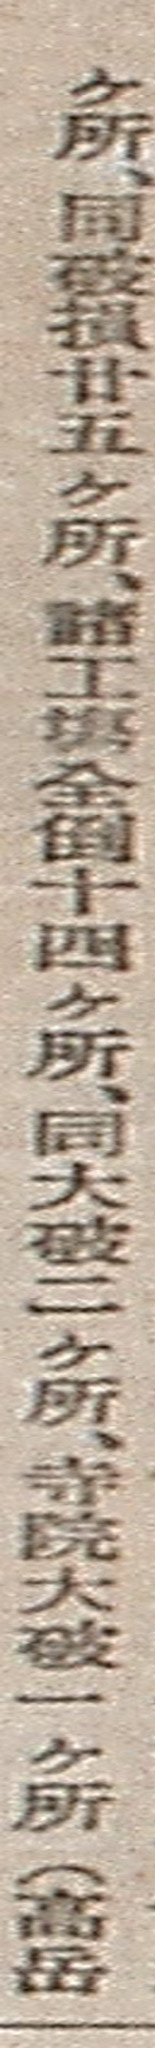ヶ所、同破損廿五ヶ所、諸工場全倒十四ヶ所、同大破二ヶ所、寺院大破一ヶ所（高岳
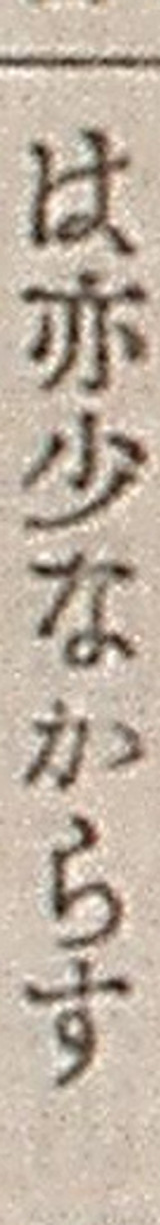は亦少なからず

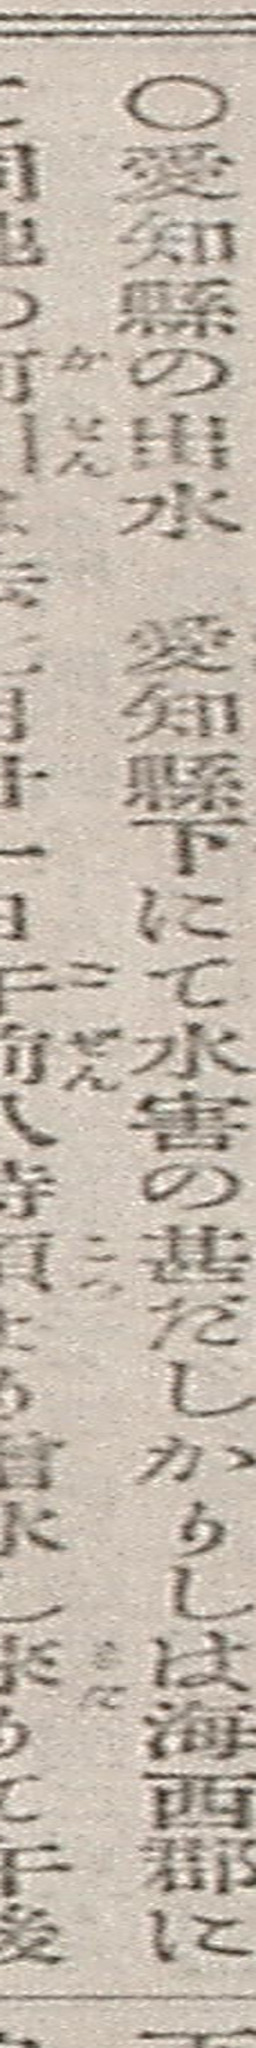て同地の河川は去七月廿一日午前八時頃より増水し来りて午後
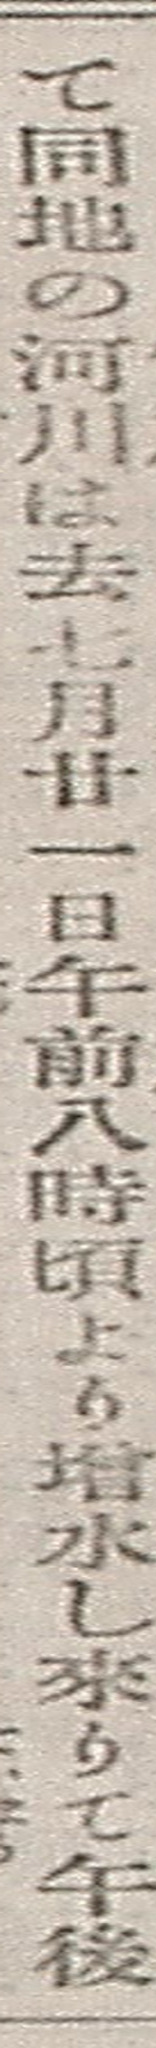て同地の河川は去七月廿一日午前八時頃より増水し来りて午後
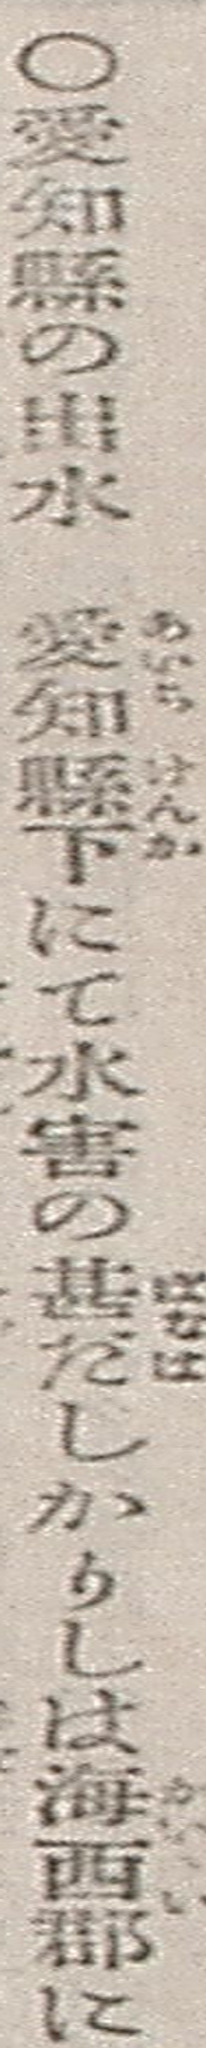◯愛知県の出水愛知県下にて水害の甚だしかりしは海西郡に
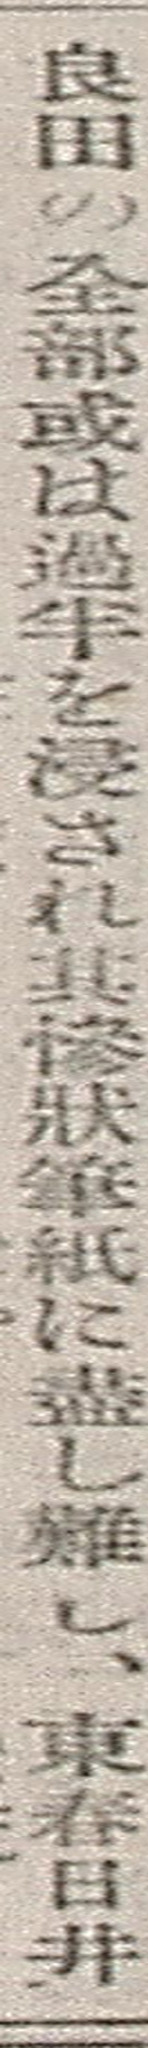良田の全部或は過半を浸され其惨状筆紙に盡し難し、東春日井
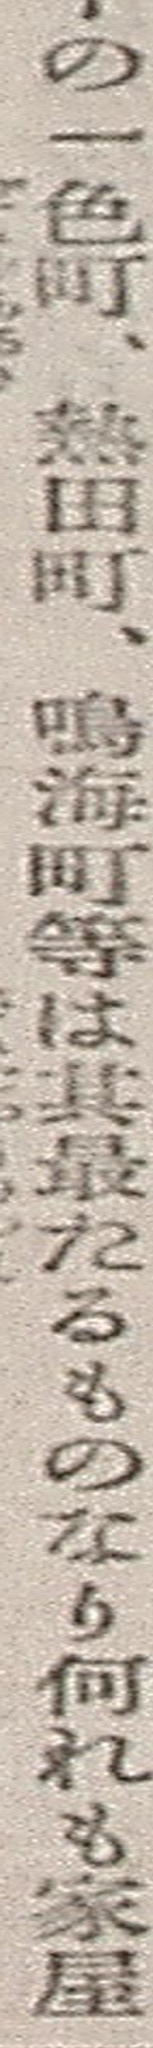下の一色町、熱田町、鳴海町等は其最たるものなり何れも屋根
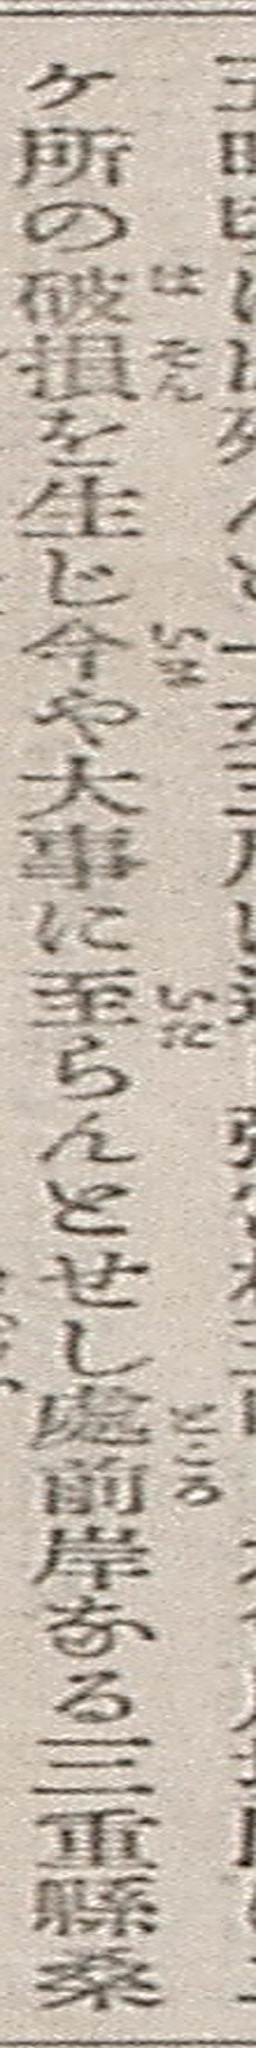ヶ所の破損を生じ今や大事に至らんとせし処前岸なる三重県桑
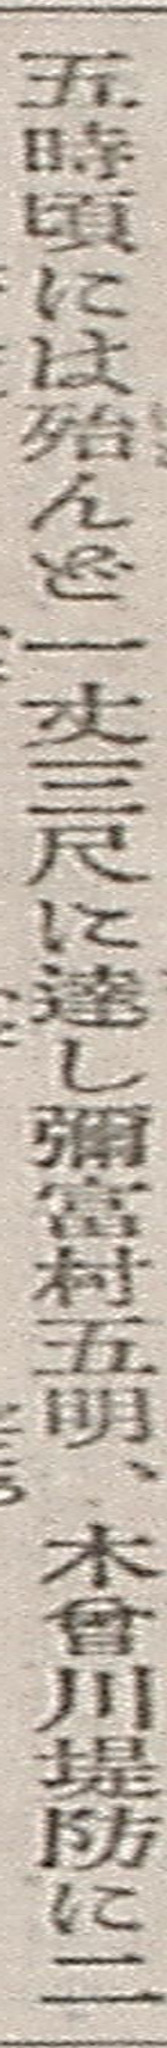五時頃には殆んど一丈三尺に達し彌富村五明、木曽川堤防に二
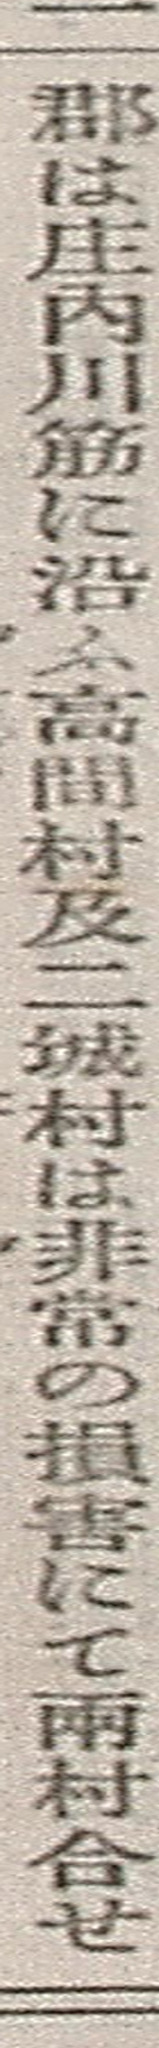郡は庄内川筋に添ふ高間村及二城村は非常の損害にて両村合せ
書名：風俗畫報臨時増刊第百二十六號　洪水被害録（中）
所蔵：東京大学地震研究所図書室 Earthquake Research Institute Library, The University of Tokyo, JAPAN
